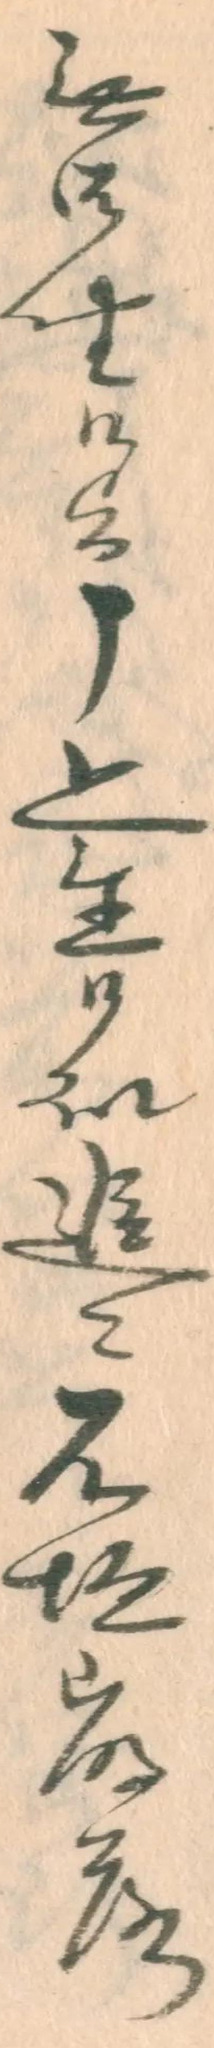無御座候旨申上置候処追々石垣崩落
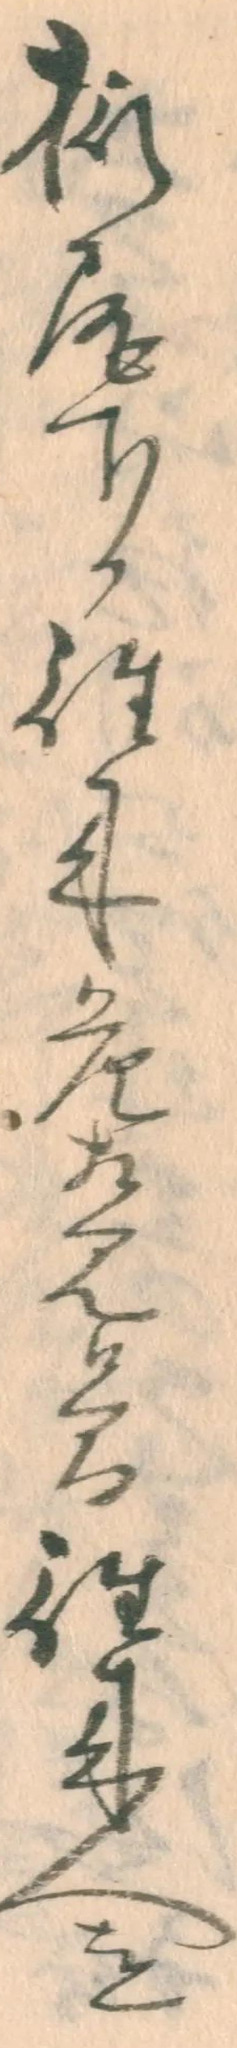桁尻下リ往来危相見候間往来人を
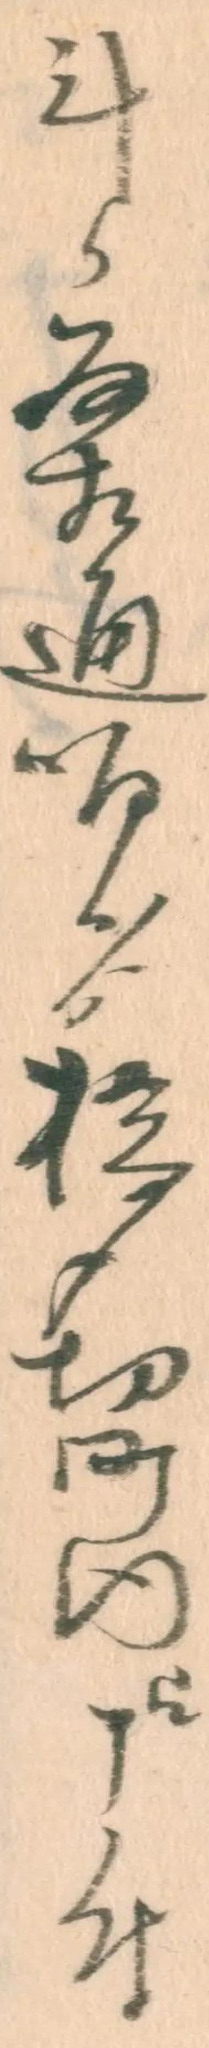計リ為相通明日ゟ橋〆切町内え申付
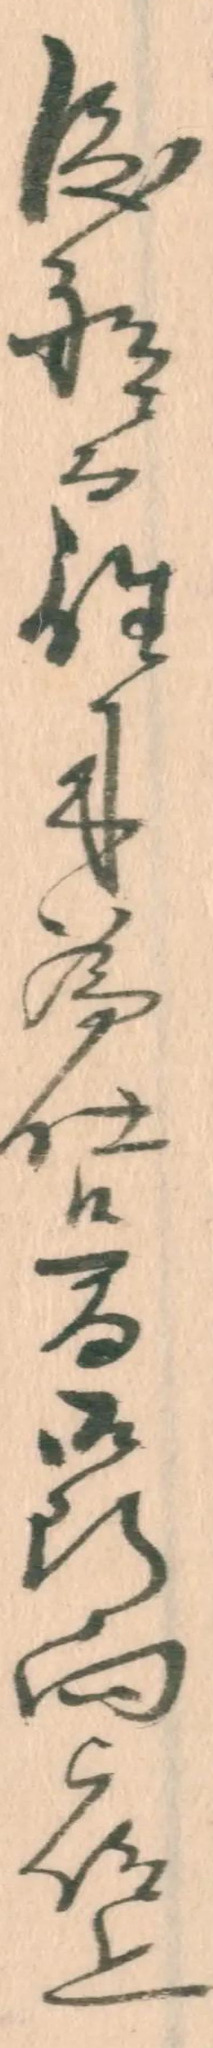渡船ニ而往来為仕候間御断向被仰上
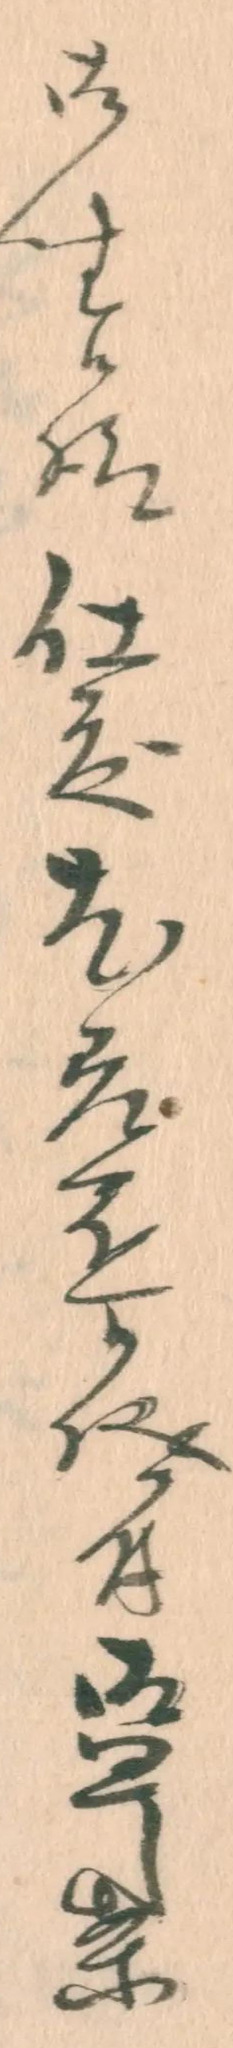御座候様仕度尤差懸候儀ニ付御御廻し案
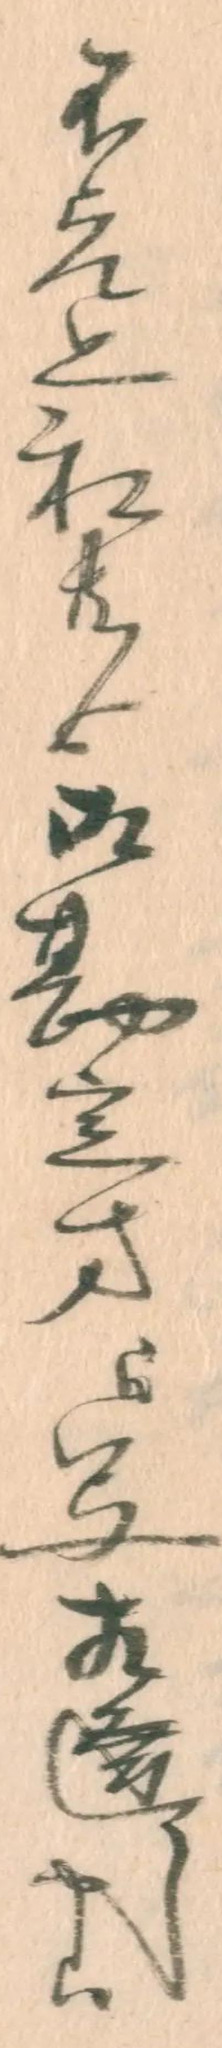不差上私共ゟ御勘定方え写相達し申候
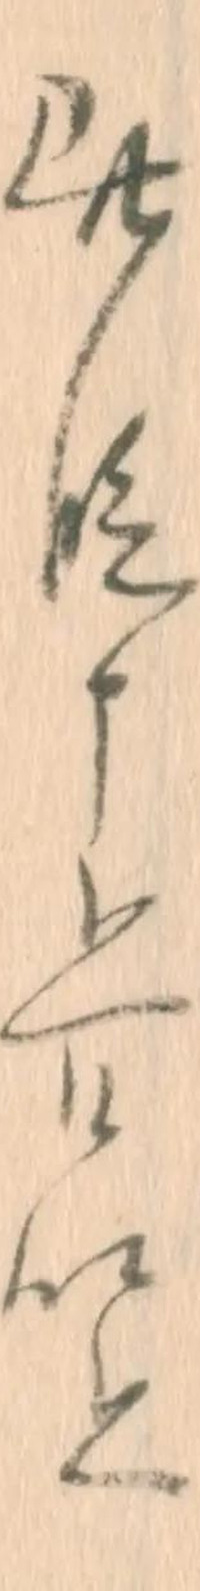此段申上候以上
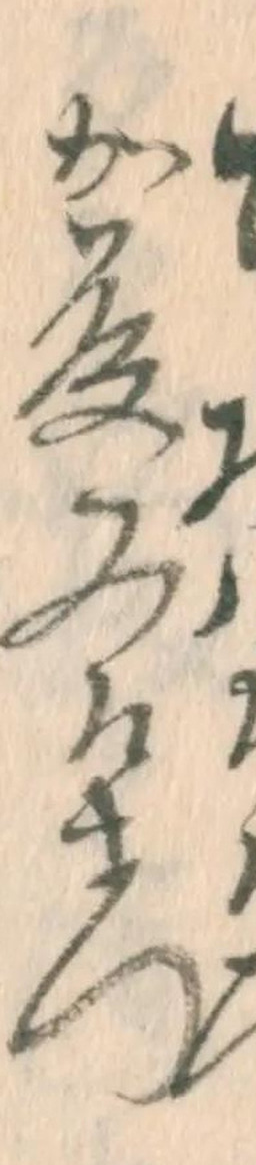加藤又左衛門

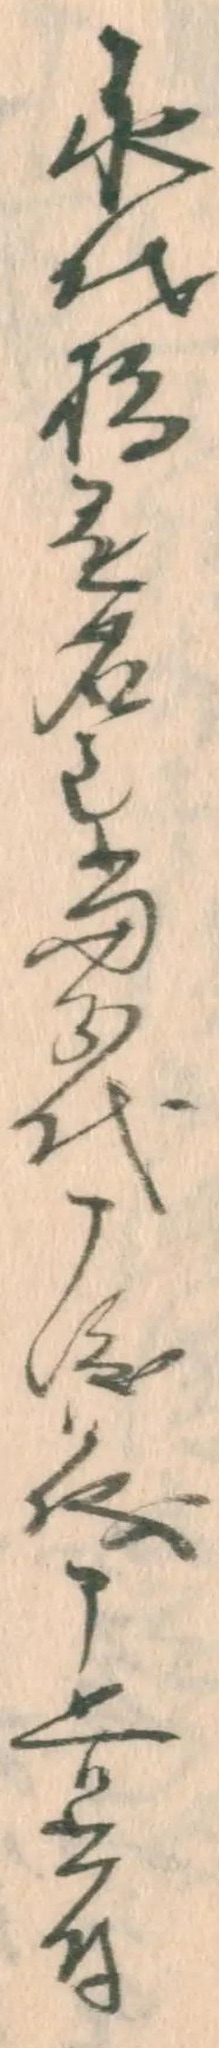│永代橋懸名主当分代申渡候儀申上候書付
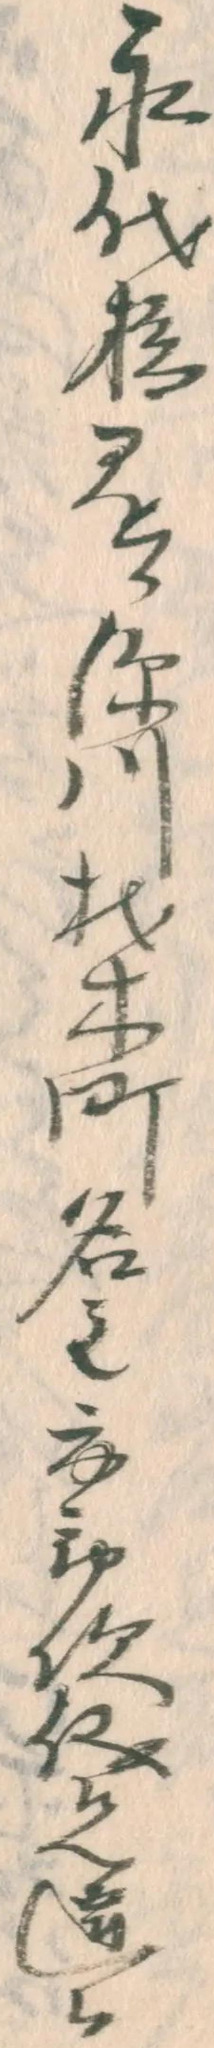永代橋懸リ深川材木町名主市郎次儀先達而
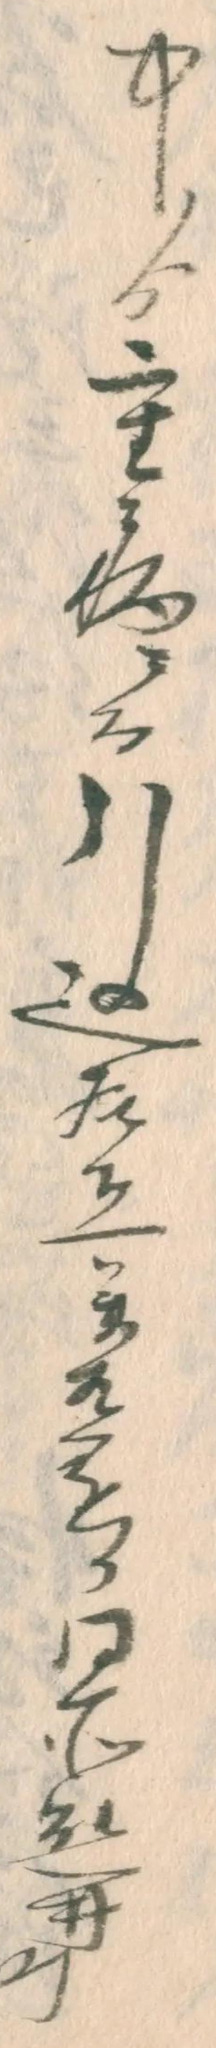中ゟ重病ニ而引込罷在并相懸リ同所熊井町

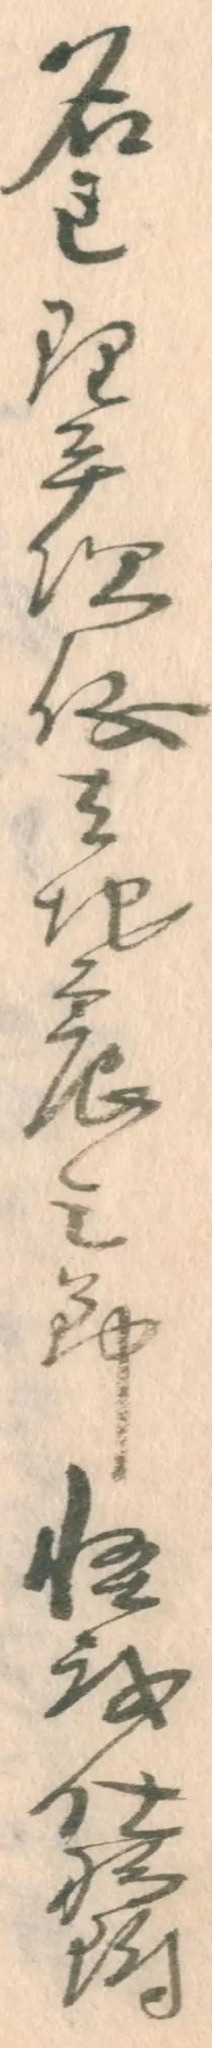名主理平次儀は地震之節怪我仕附
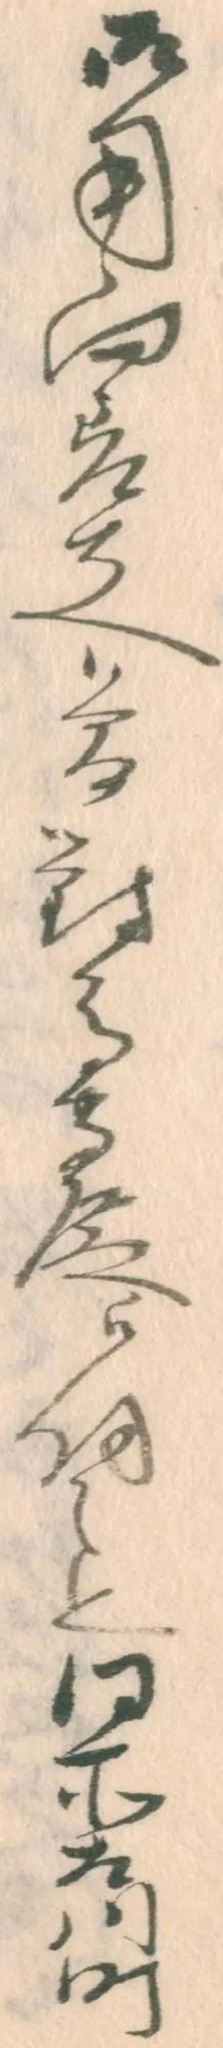御用向差支候間対馬守殿え伺之上同所相川町
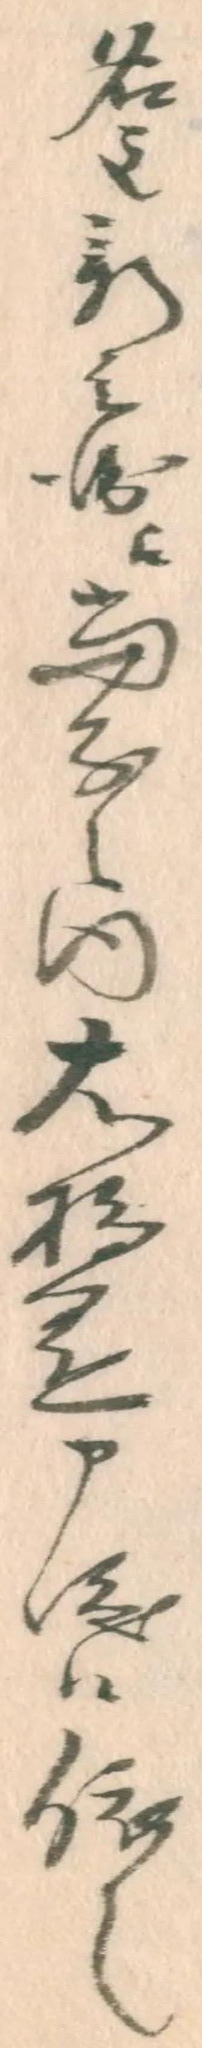名主新兵衛え当分之内右橋懸申渡候依之
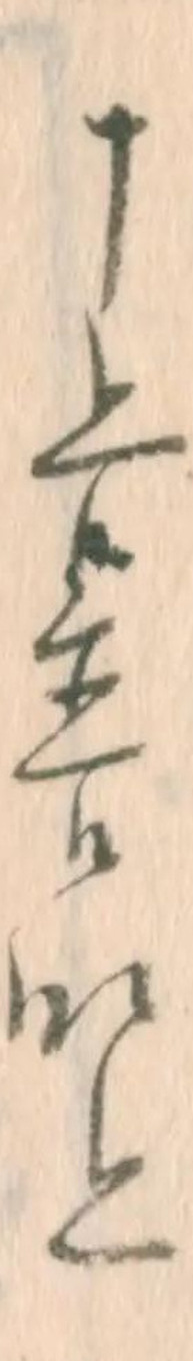申上置候以上
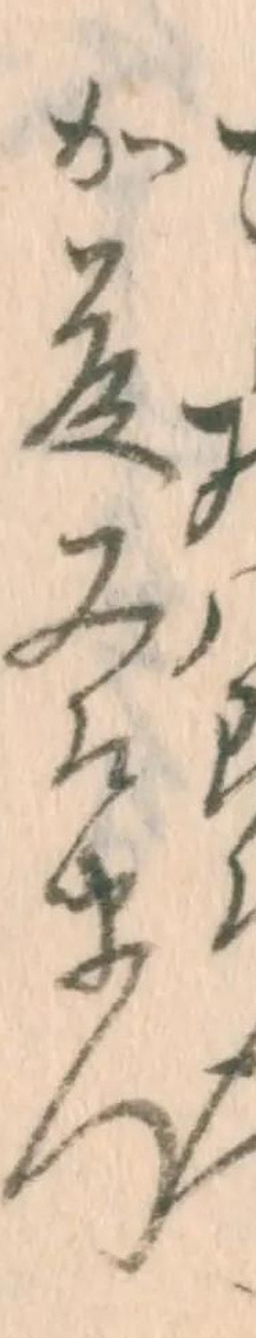加藤又左衛門
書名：地震災書留 2巻. [1] 内表紙に「地震災書留　安政二卯年　但本所深川御用屋敷地代免除調」とあり
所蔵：国立国会図書館 National Diet Library, JAPAN
